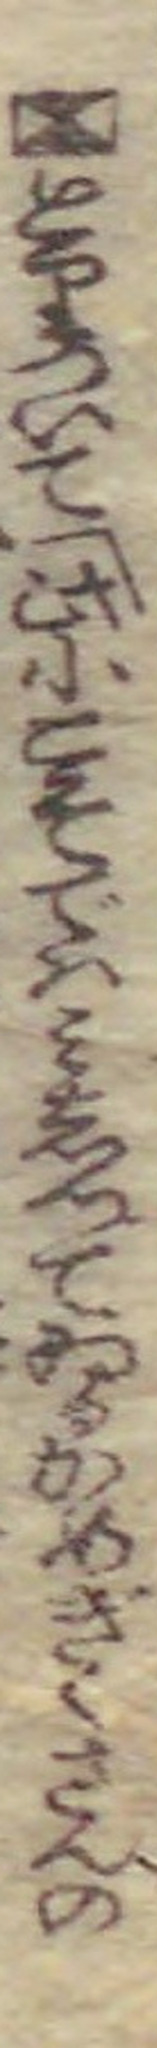▼▲とりついて〽此小そではみしつてゐるかめぎくさんの
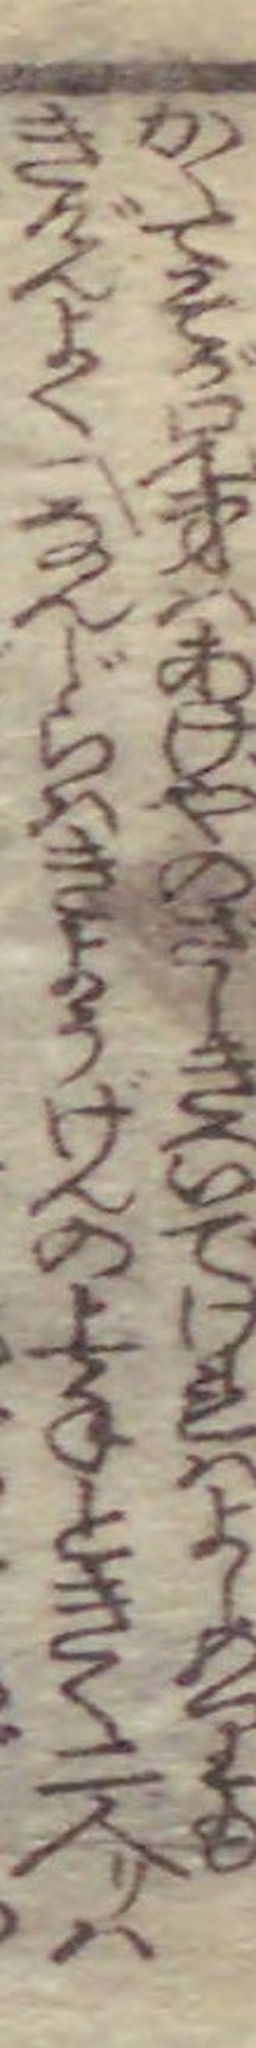きげんよく〽なんじらはきようげんの上手ときく二人は
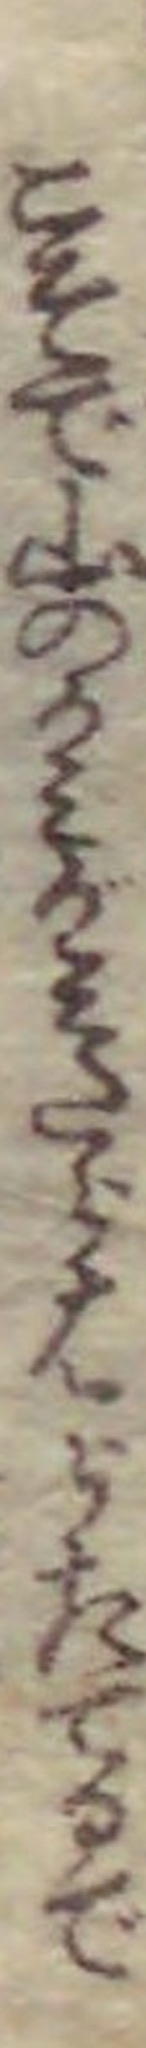こそで山のかみがみたらはらたてるで
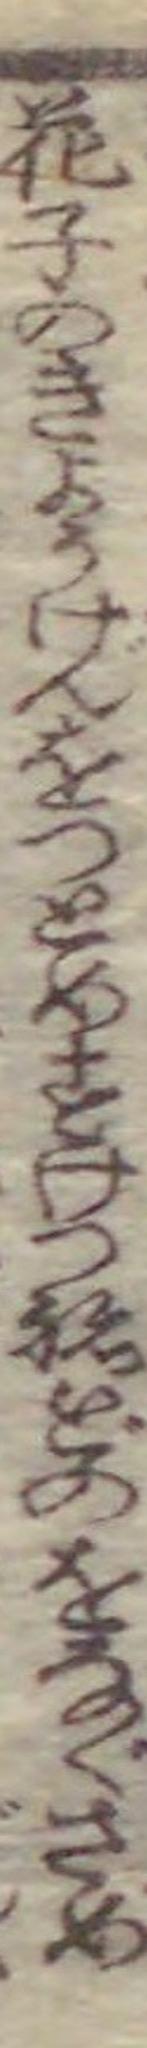花子のきようげんをつとめすけつねどのをなぐさめ
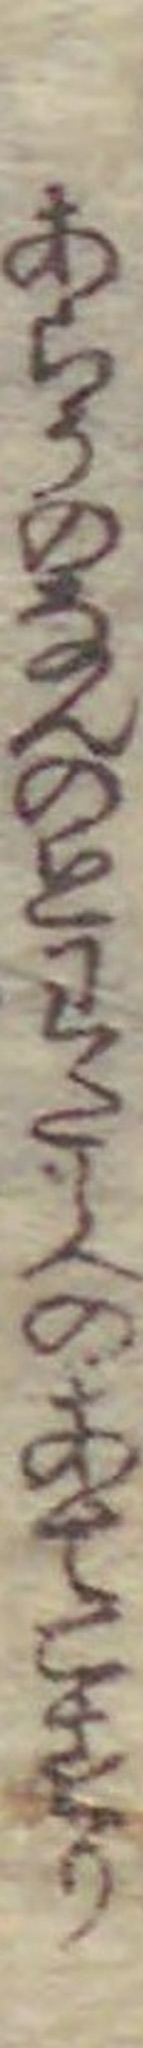あらうのなんのとわたしへのあてこすり
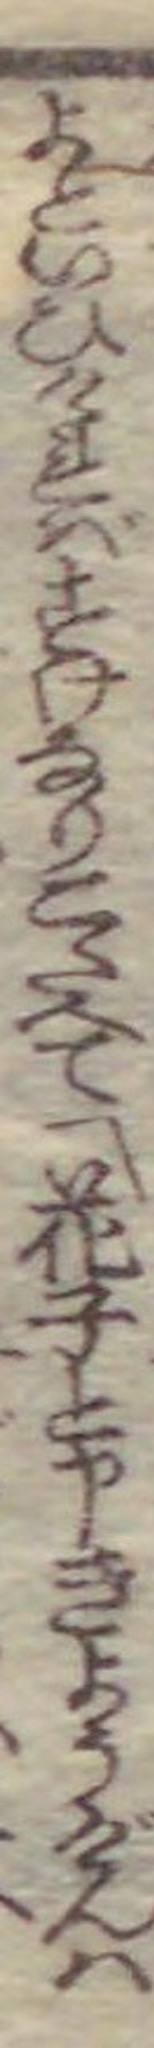よといひければすけなりこたへて〽花子と申きょうげんは
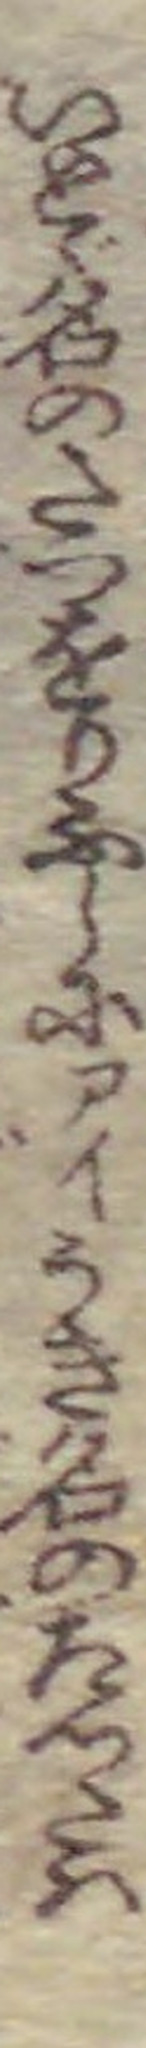いとゞ名のたつをりふしにアイうき名のたつたは
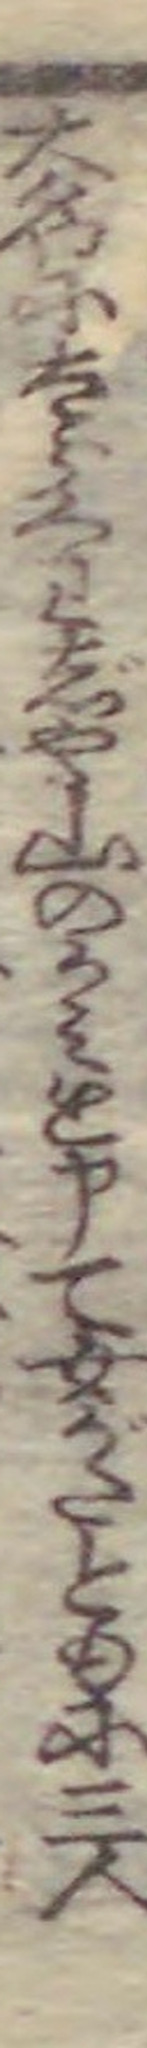大名に太郎くわじや山のかみと申て女がたともに三人
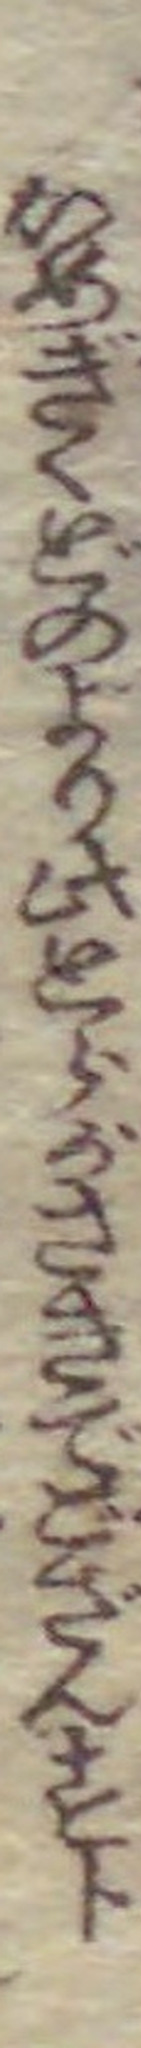ひめぎくどのより此とらがさきでござんすと
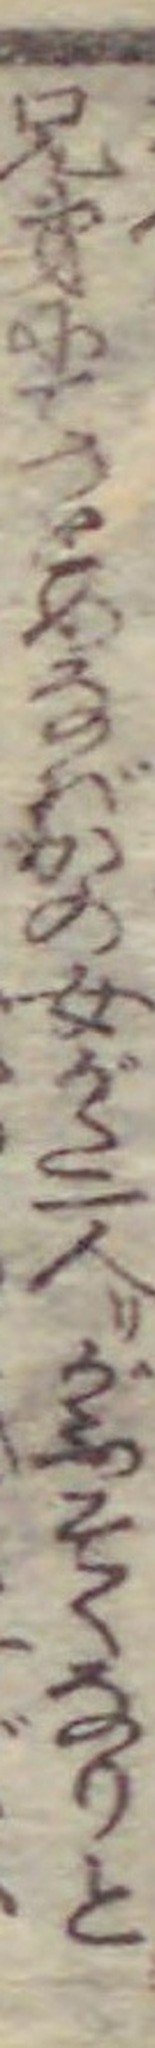兄弟にてつとめなばかの女がた二人がふそくなりと
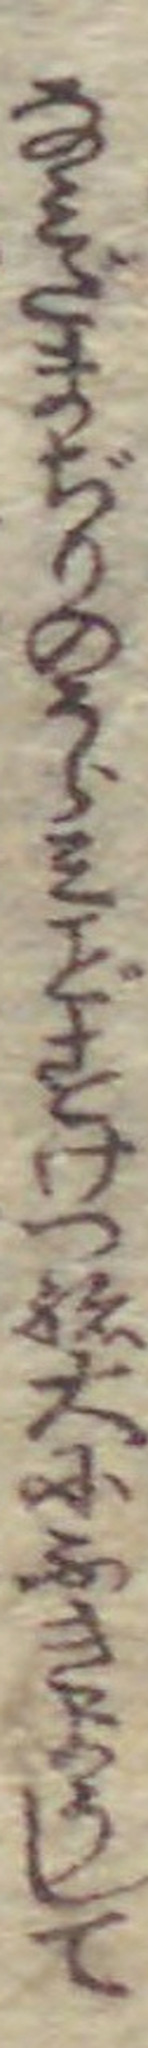なみだまぢりのうらみごとすけつね大にふきようして
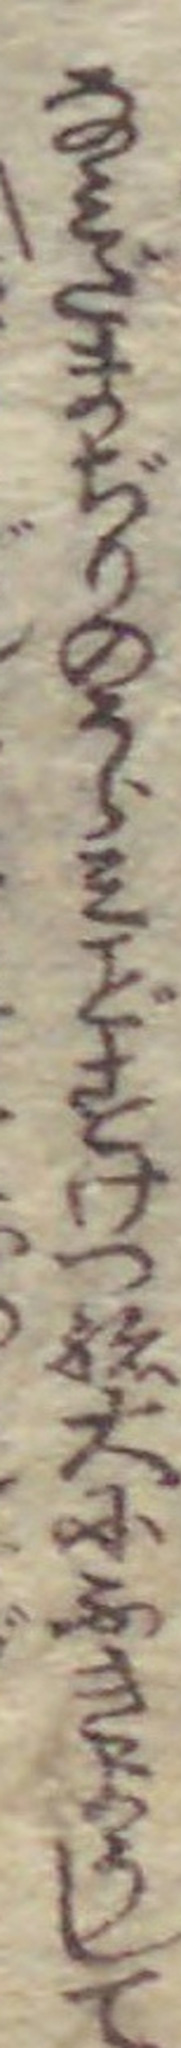なみだまぢりのうらみごとすけつね大にふきようして
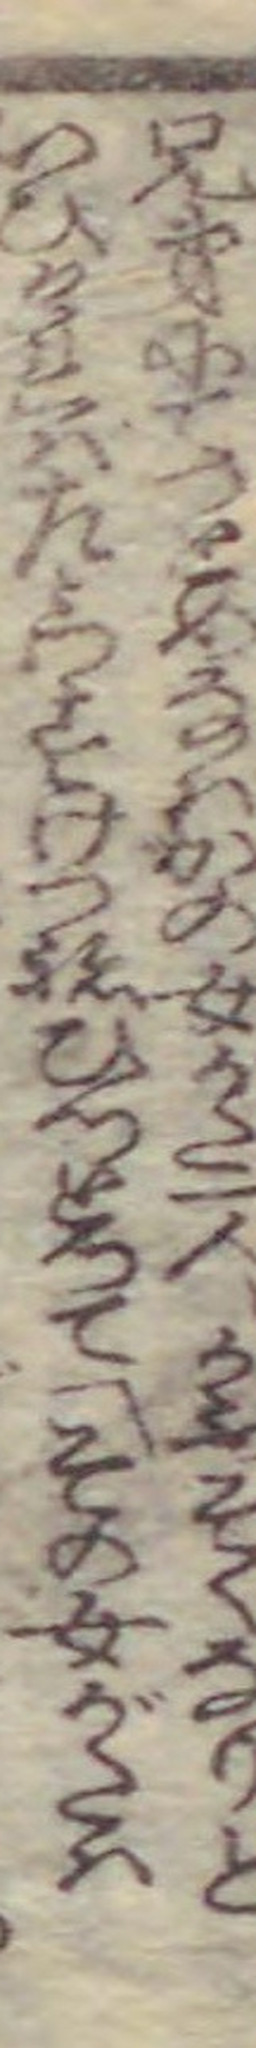いひければ左衛門すけつねひつとつて〽その女がたは
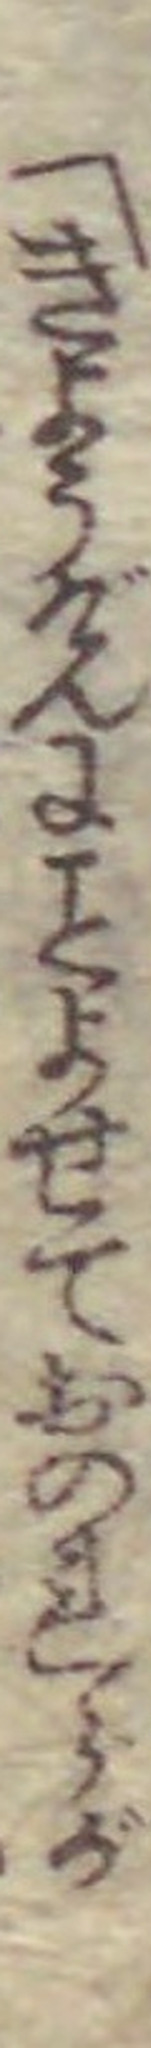〽きようげんにことよせておのれらが
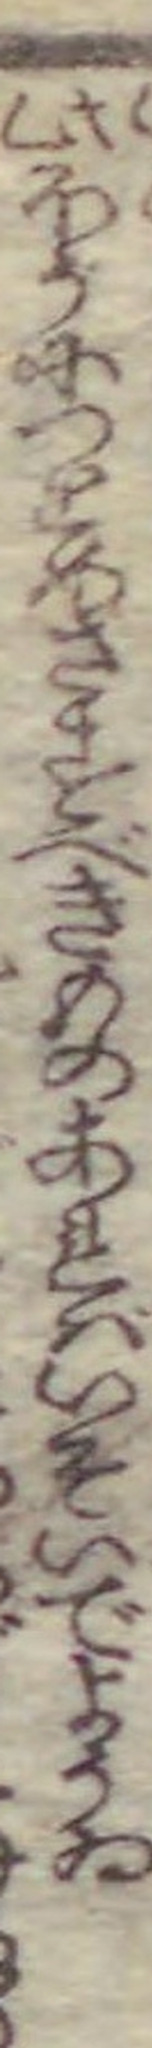此ほうにととめさすべきものあればいそいでようゐ
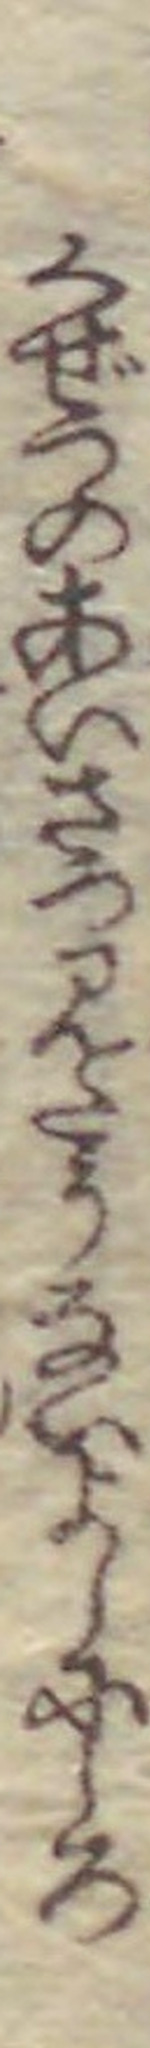くぜつのあいさつ見たうないよしにしろ
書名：大時代唐土化物 3巻. 曽我太夫染
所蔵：国立国会図書館 National Diet Library, JAPAN
